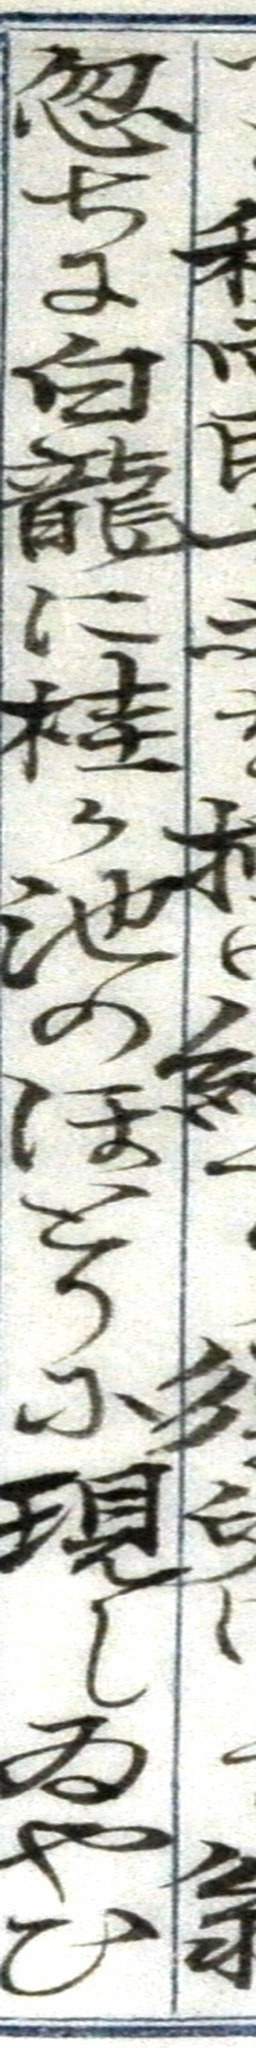忽ちに白龍に桂か池のほとりに現しゐやひ
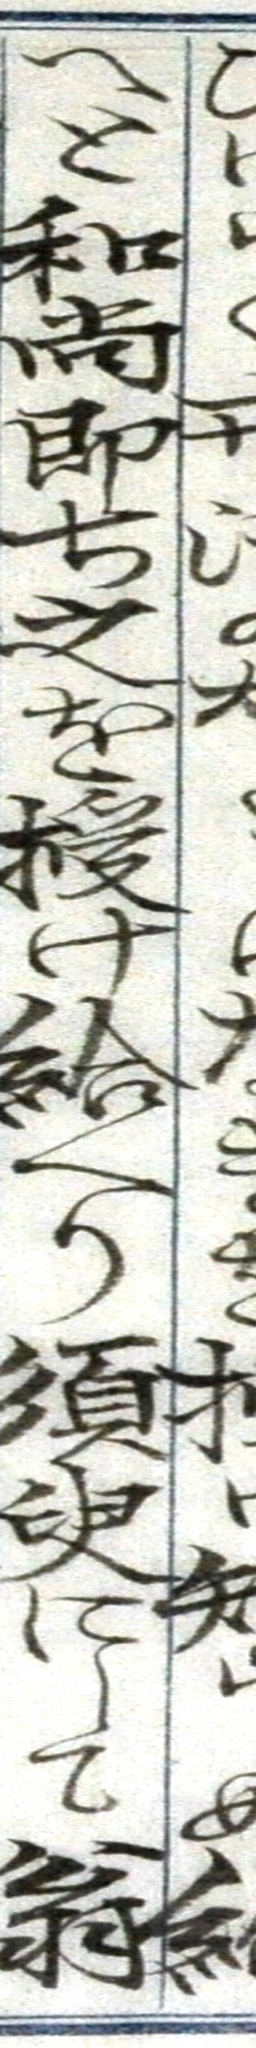へと和尚即ち之を授け給へり須臾にして翁
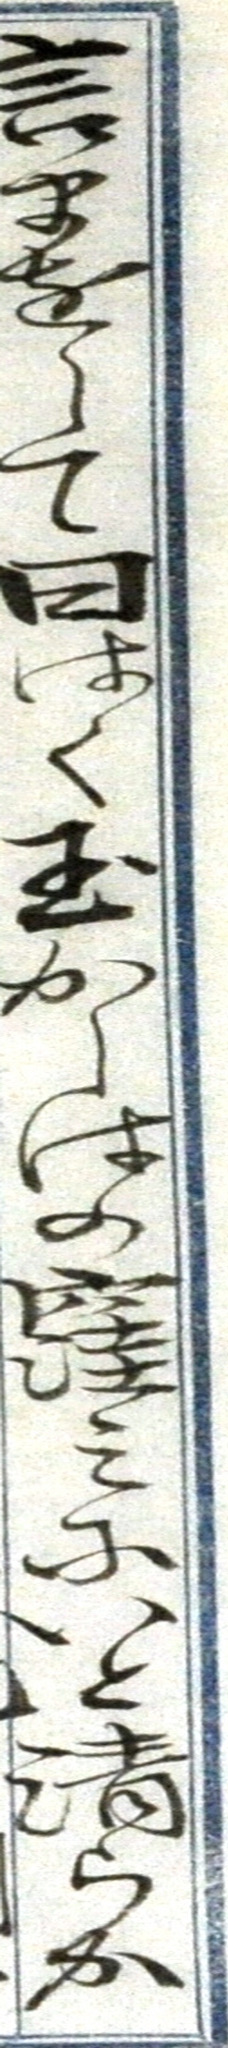言まをして曰はく玉かしはの窪ミにいと清らか
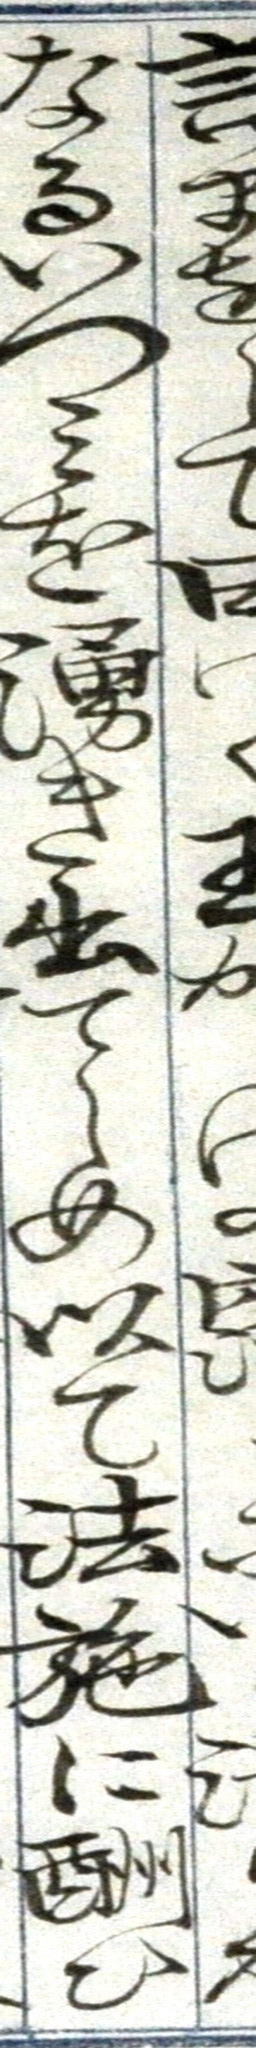なるいつミを湧き出てしめ以て法施に酬ひ
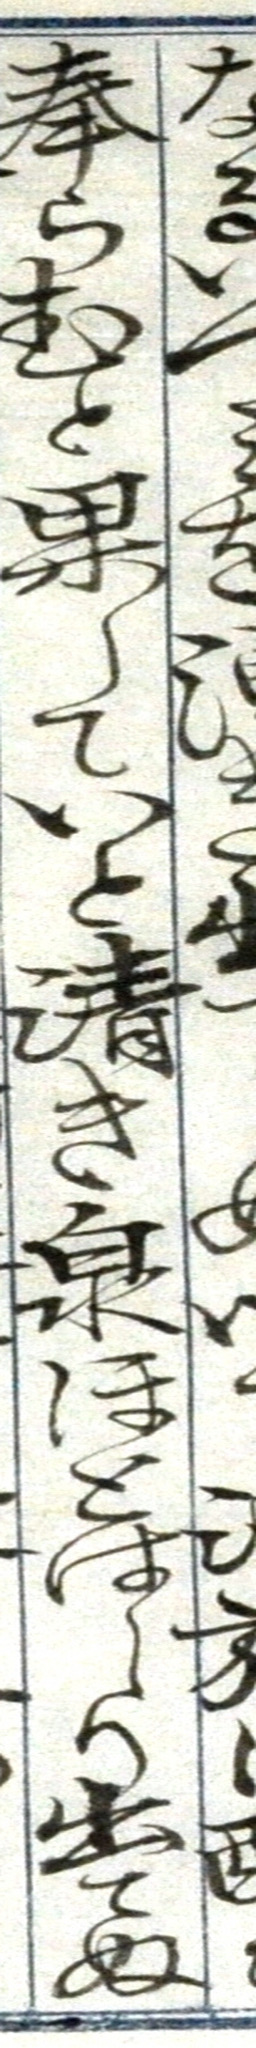奉らむと果していと清き泉ほとはしり出てぬ
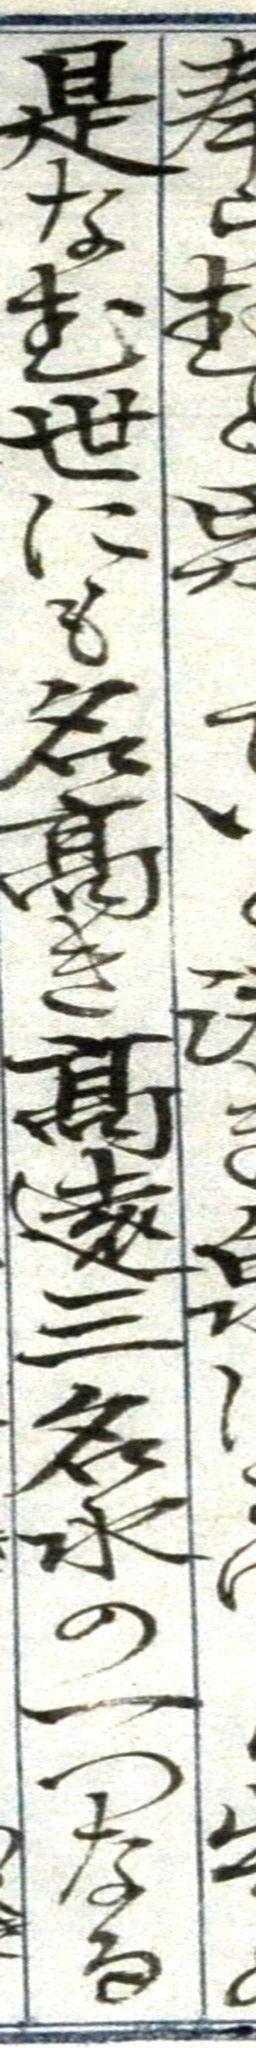是なむ世にも名高き高遠三名水の一つなる
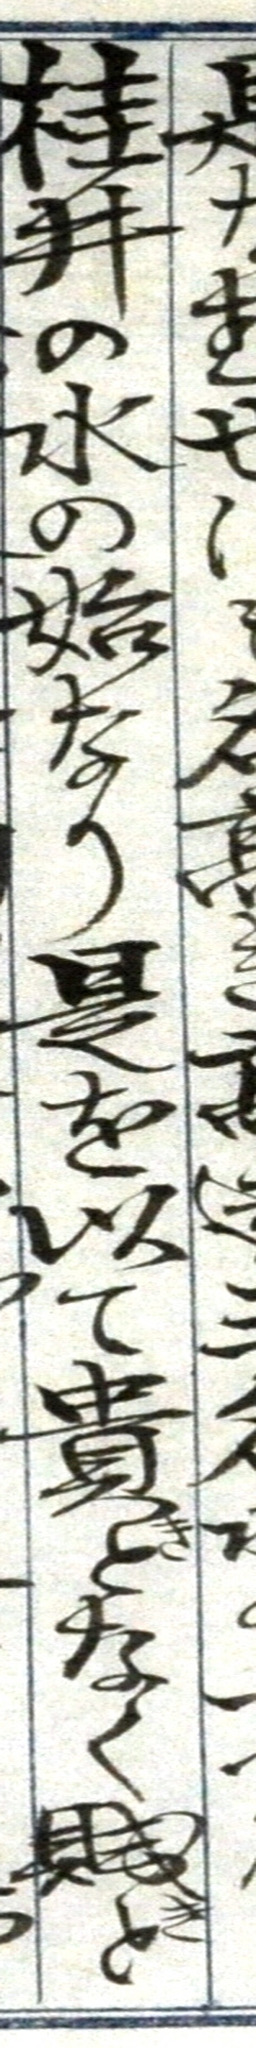桂井の水の始なり是を以て貴きとなく賎きと
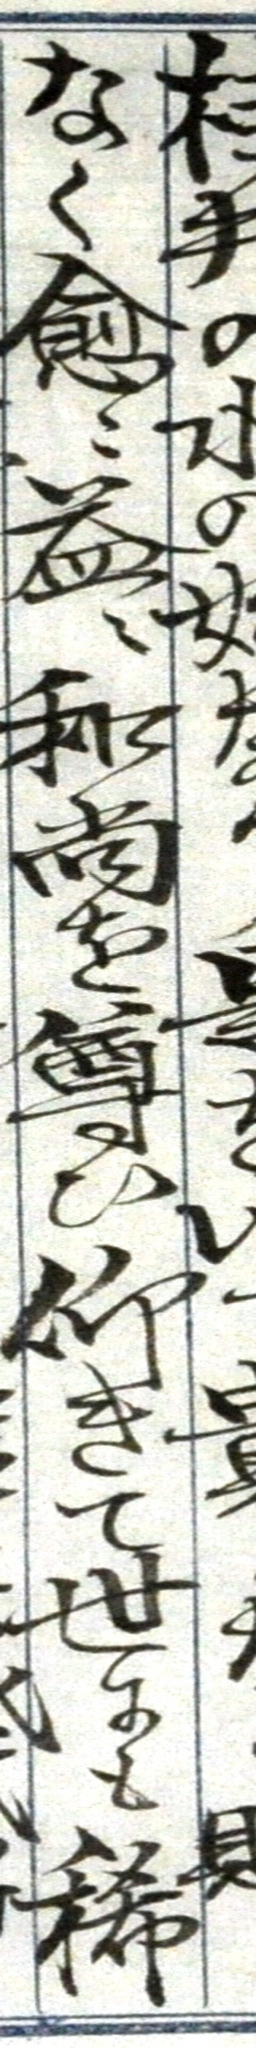なく愈々益々和尚を尊ひ仰きて世にも稀
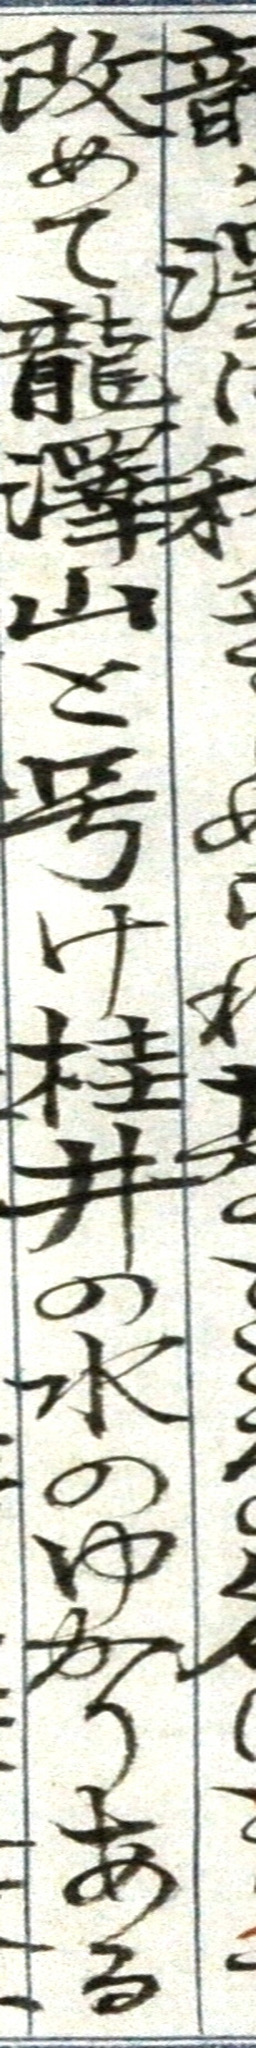改めて龍澤山と号け桂井の水のゆかりある
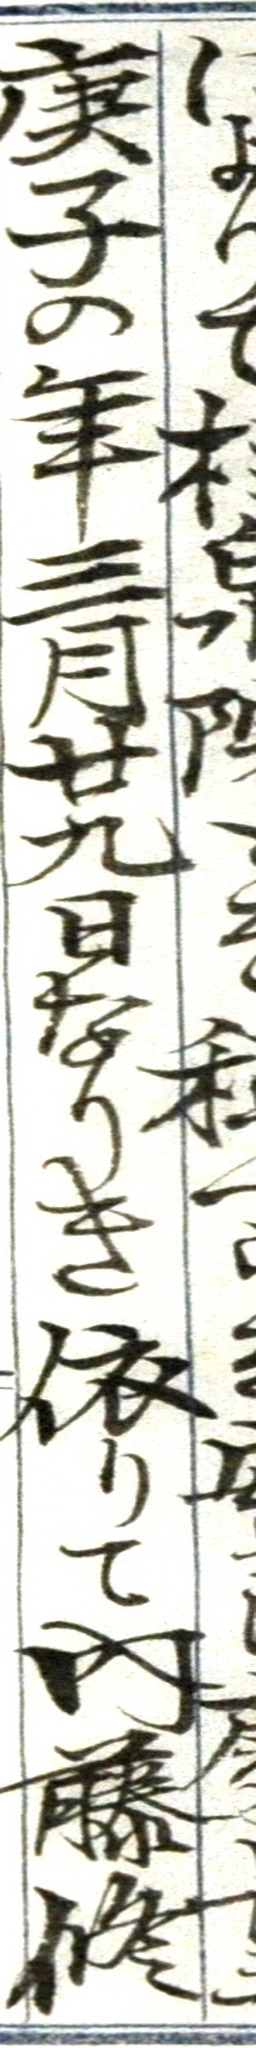庚子の年三月廿九日なりき依りて内藤修
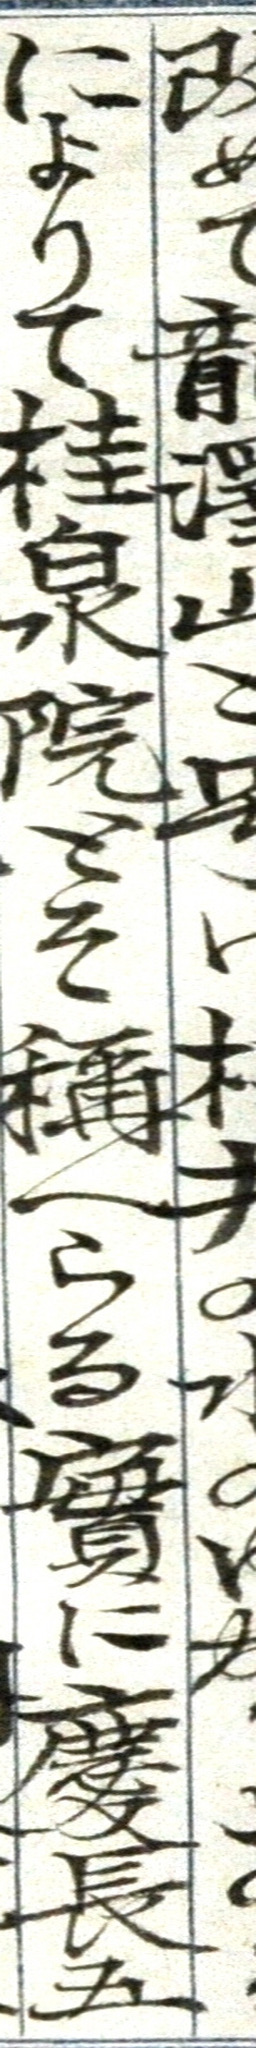によりて桂泉院とそ称へらる実に慶長五

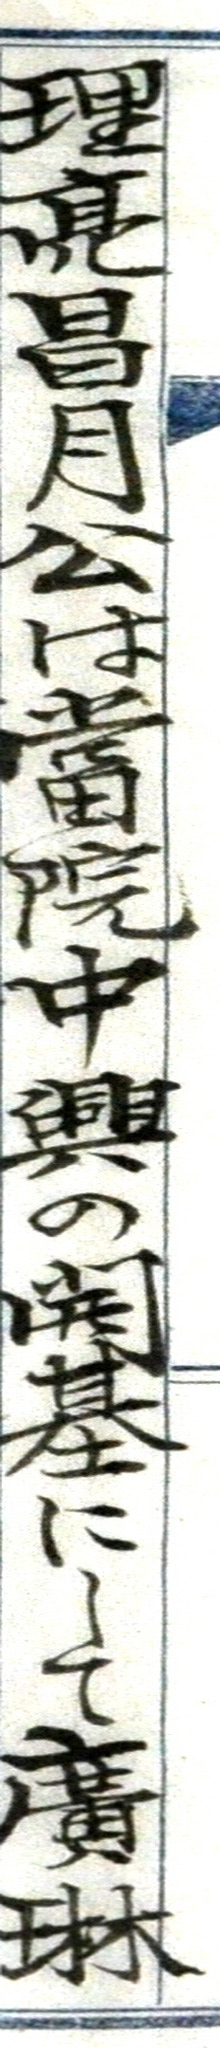理亮昌月公は当院中興の開基にして広琳
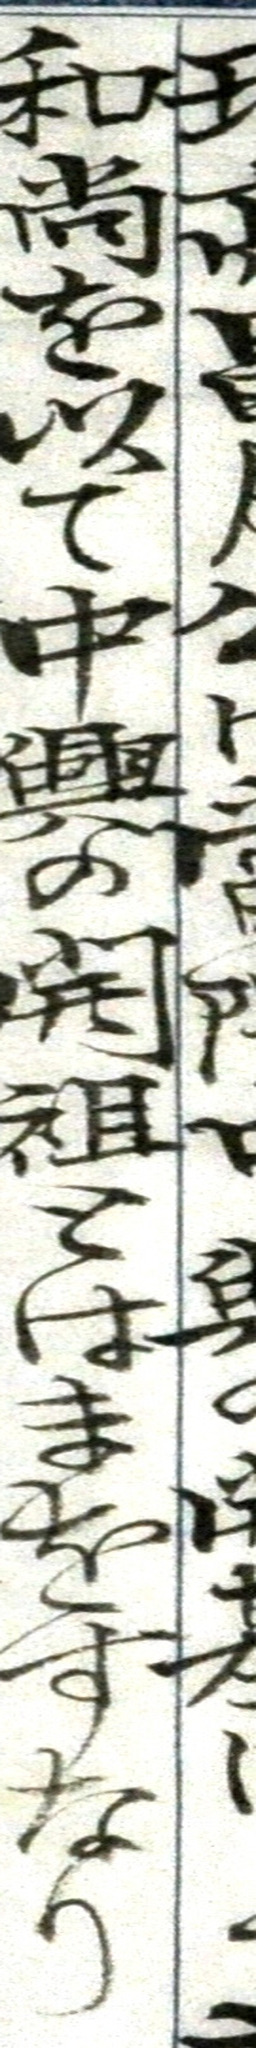和尚を以て中興の開祖とはまをすなり
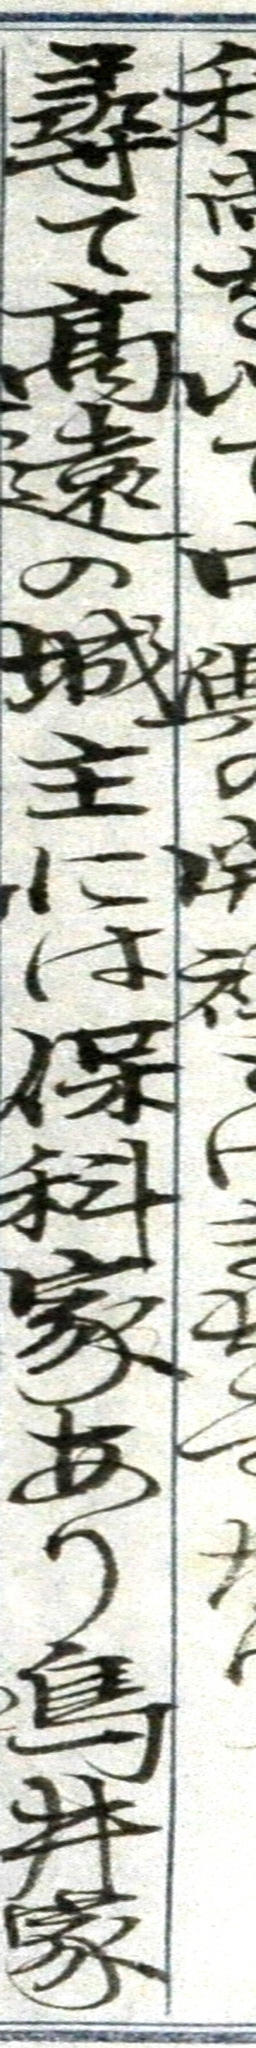尋て高遠の城主には保科家あり鳥井家
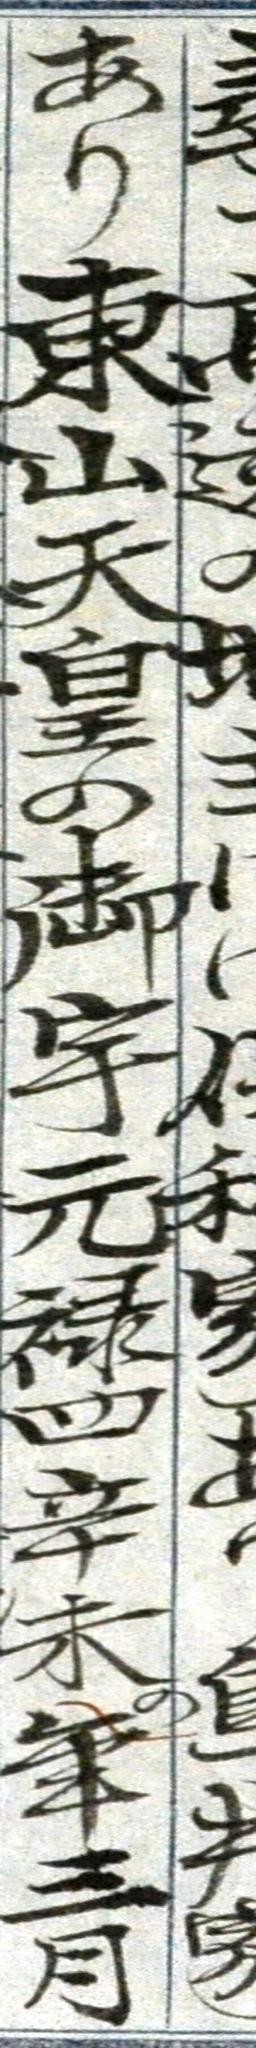あり東山天皇の御宇元禄四辛未の年三月
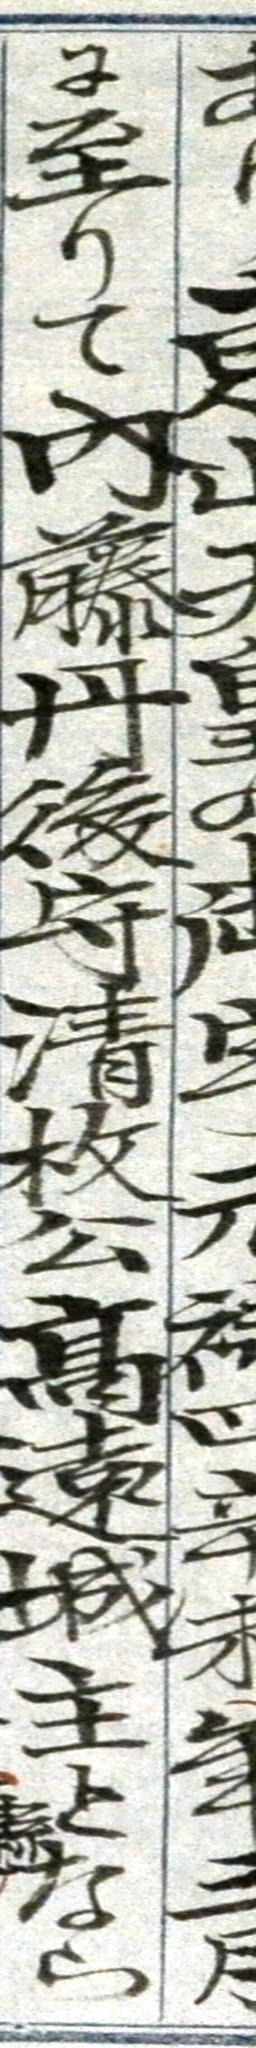に至りて内藤丹後守清枚公高遠城主となら
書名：桂泉院・樹林寺・東光寺縁起書、蓮華寺由来書、付夕顔観音記
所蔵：伊那市立高遠町図書館・合同会社AMANE
